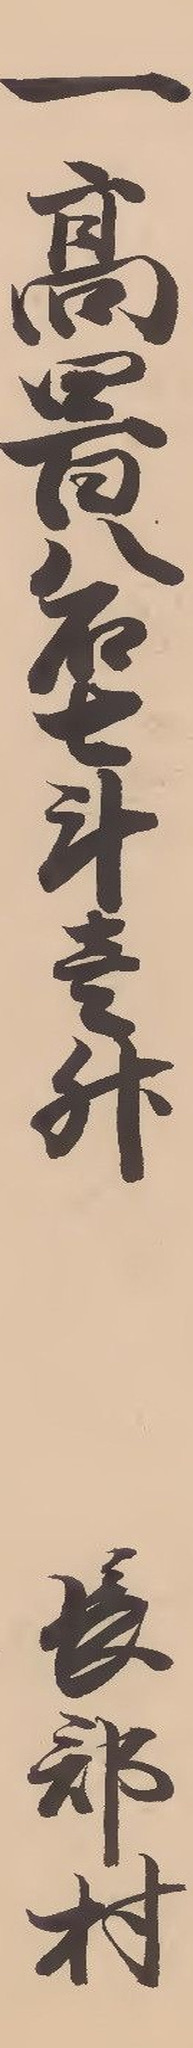一高四百八石七斗壱升長部村
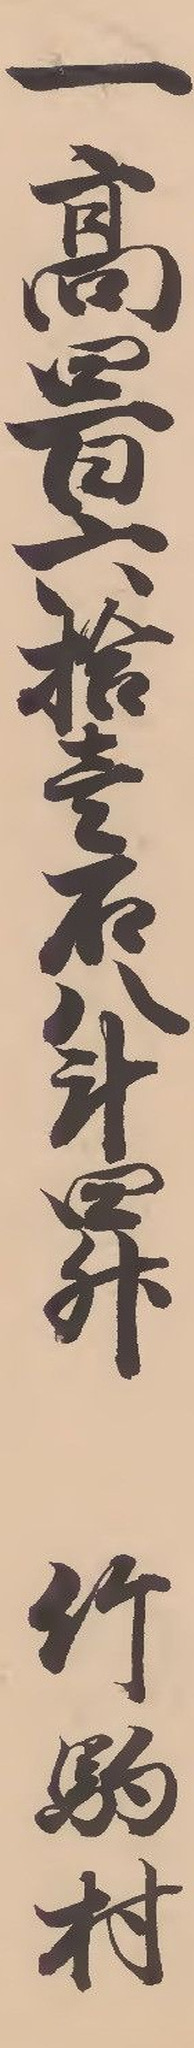一高四百六拾壱石八斗四升竹駒村

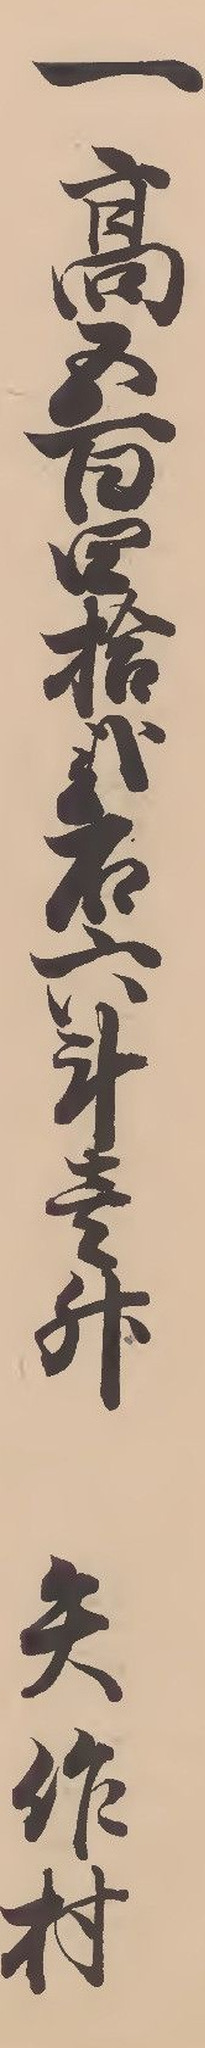一高五百四拾弐石六斗壱升矢作村
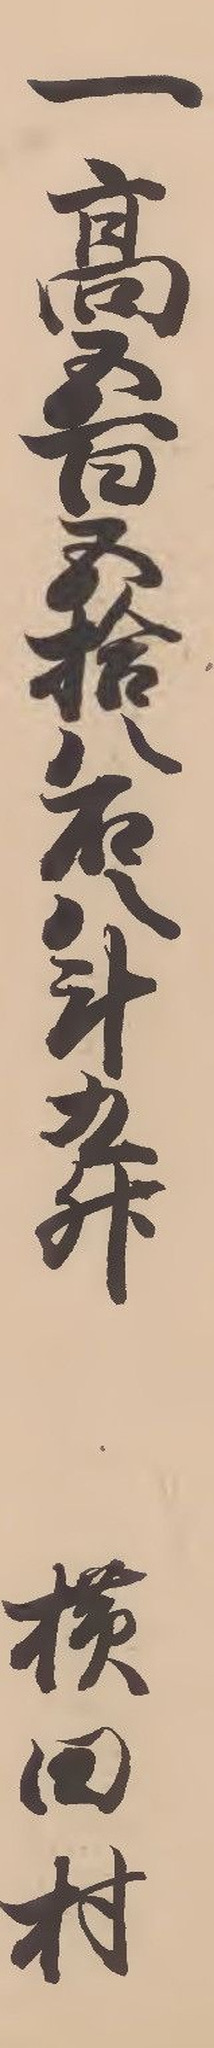一高五百五拾八石八斗九升横田村
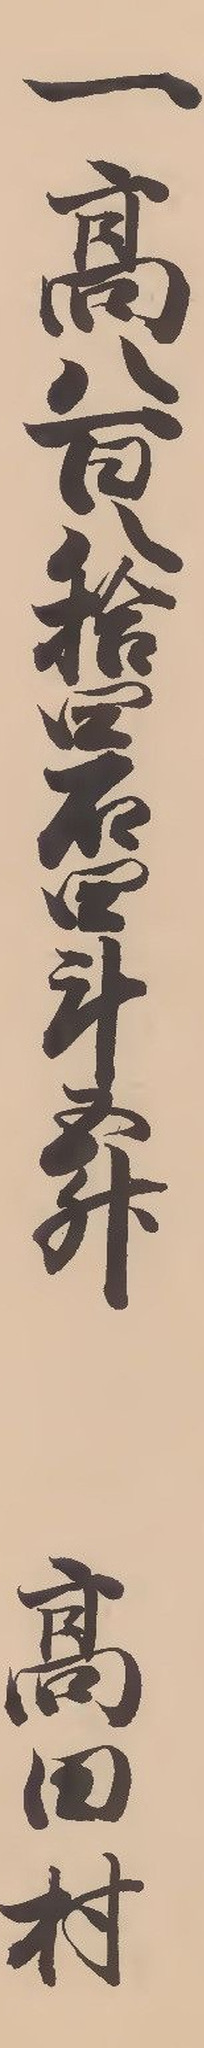一高八百八拾四石四斗五升高田村
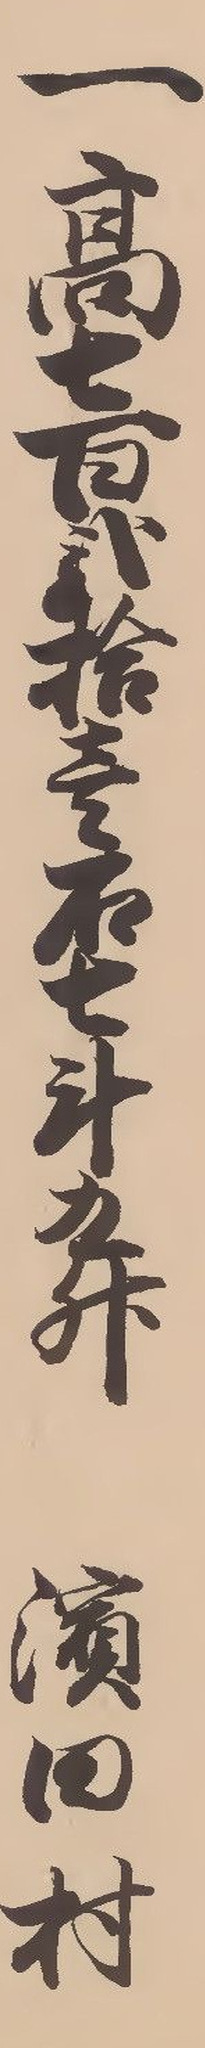一高七百弐拾壱石七斗九升浜田村
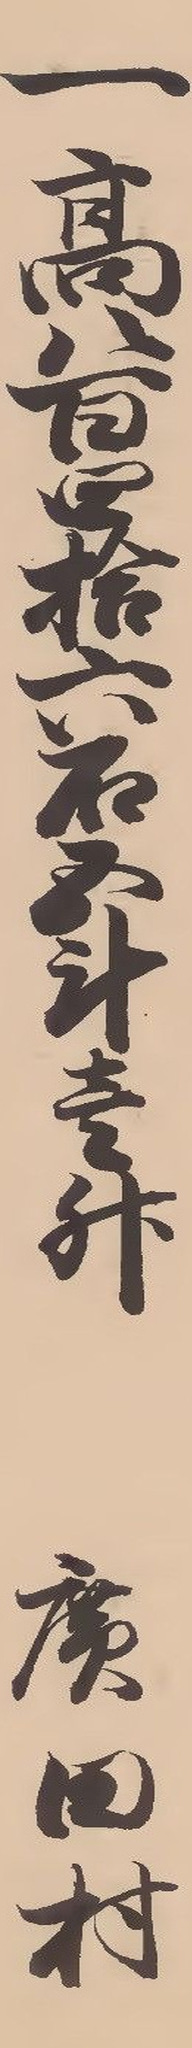一高八百四拾六石五斗壱升広田村
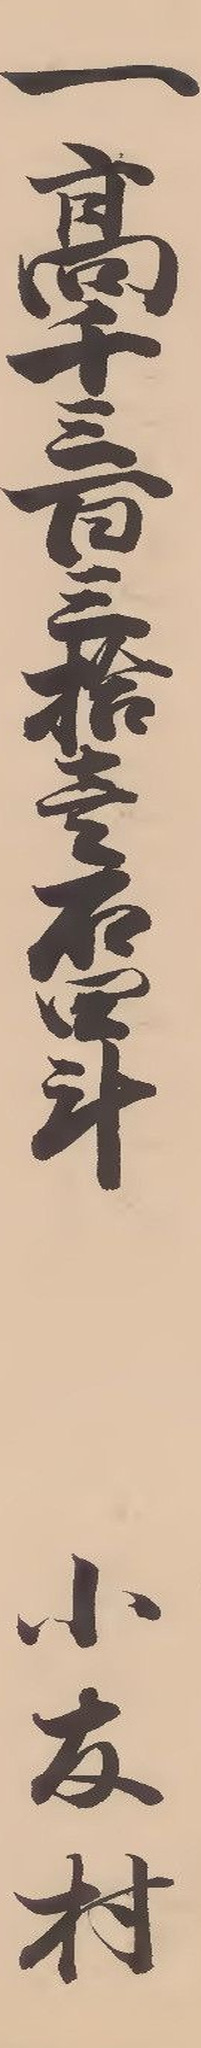一高千三百三拾壱石四斗小友村
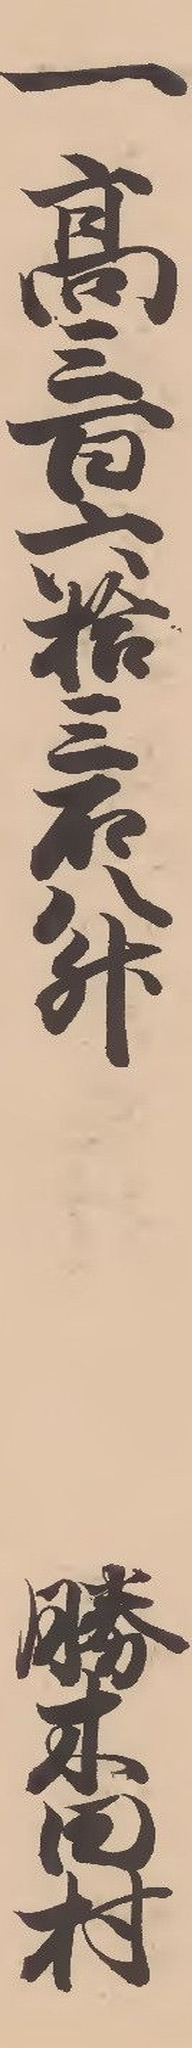一高三百六拾三石八升勝木田村
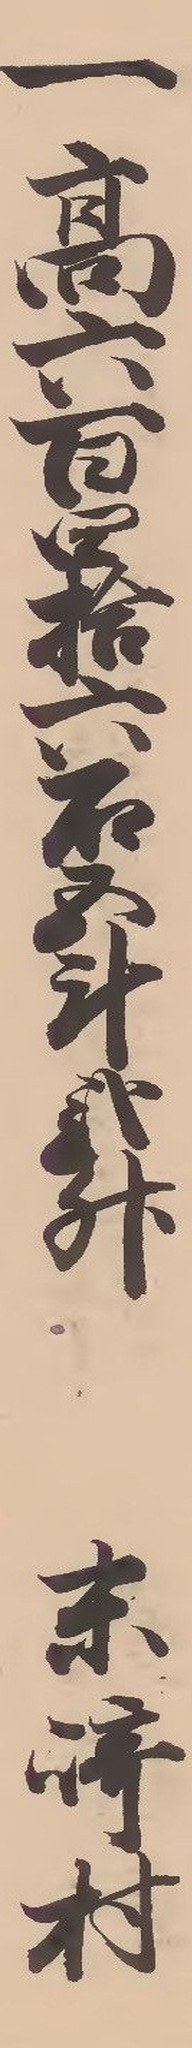一高六百四拾六石五斗弐升末崎村

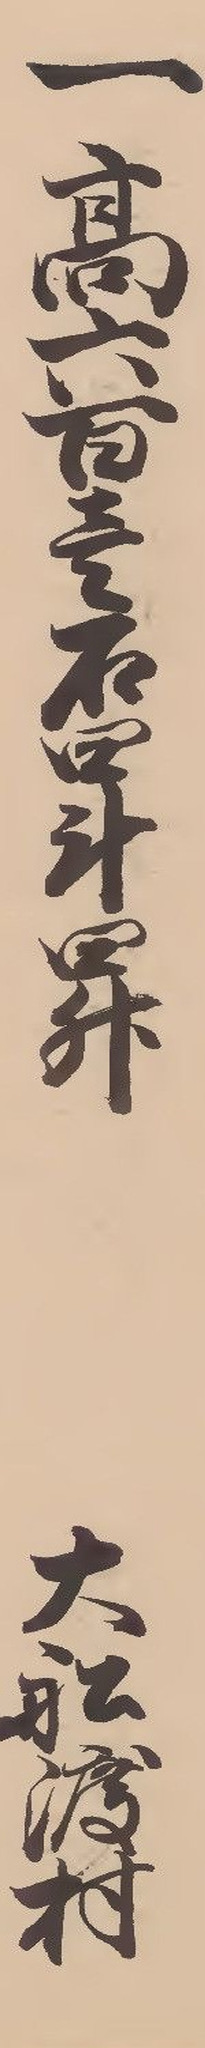一高六百壱石四斗四升大船渡村
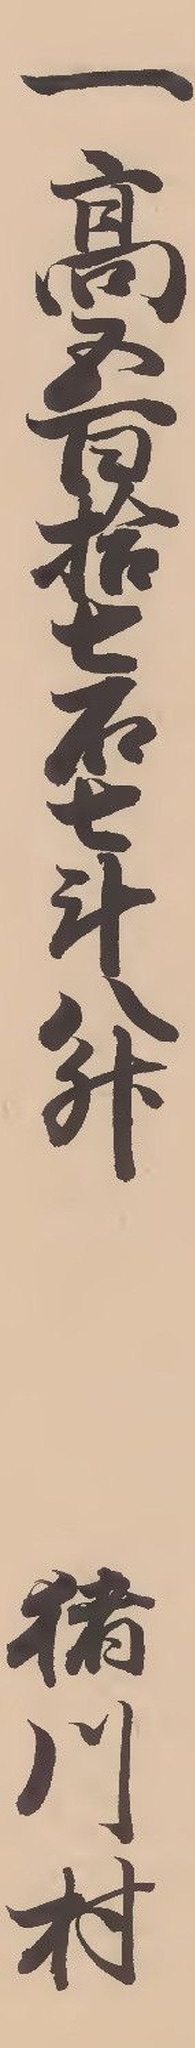一高五百拾七石七斗八升猪川村
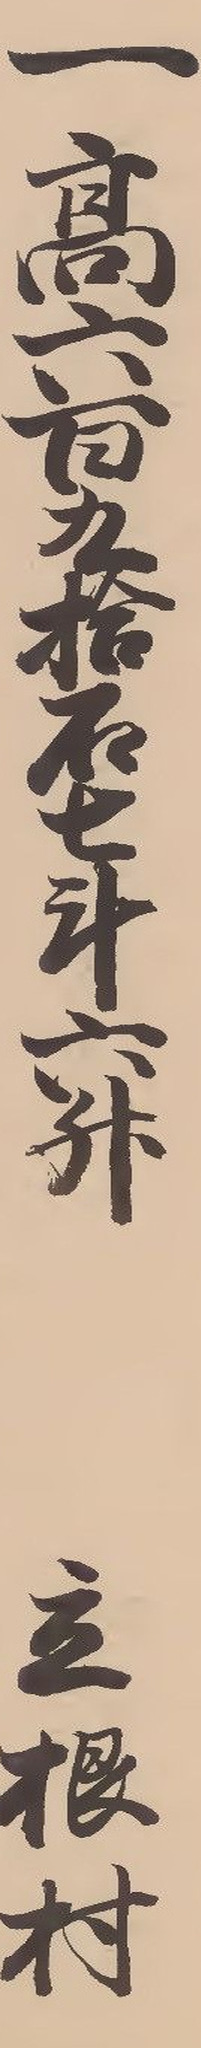一高六百九拾石七斗六升立根村
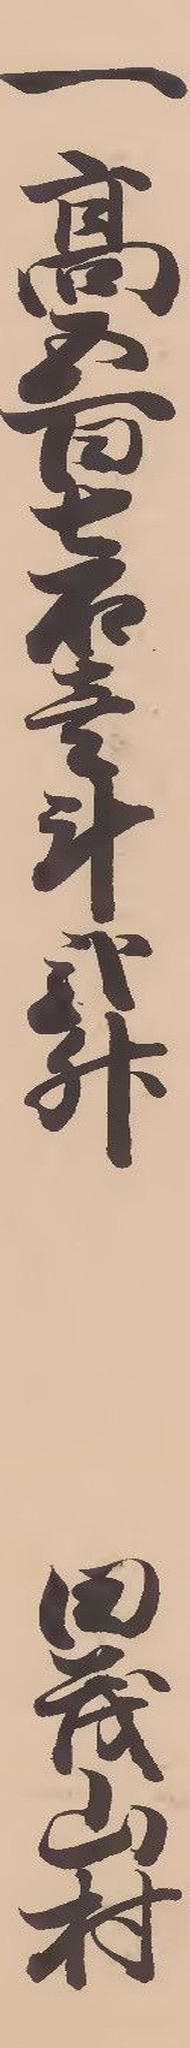一高五百七石壱斗弐升田茂山村
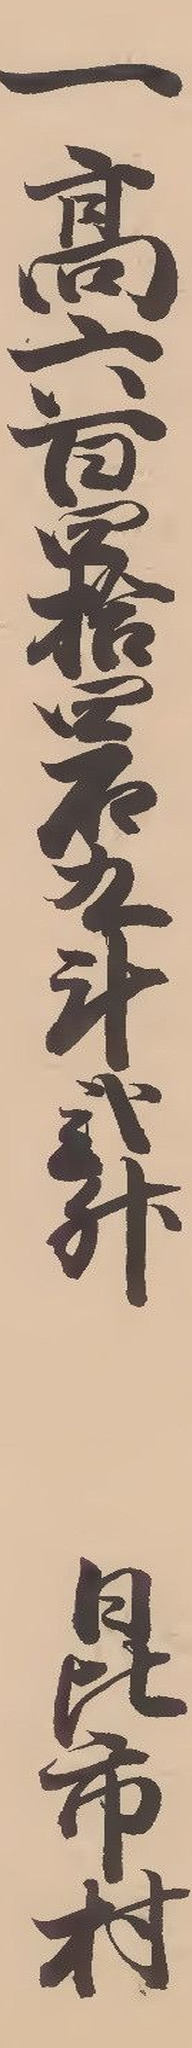一高六百四拾四石九斗弐升日比市村
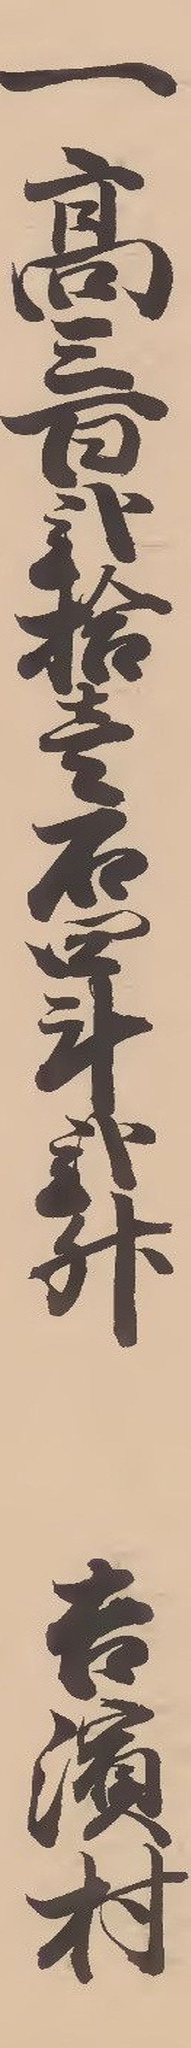一高三百弐拾壱石四斗弐升吉浜村
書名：陸奥国郷帳　５
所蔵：国立公文書館 National Archives of Japan
